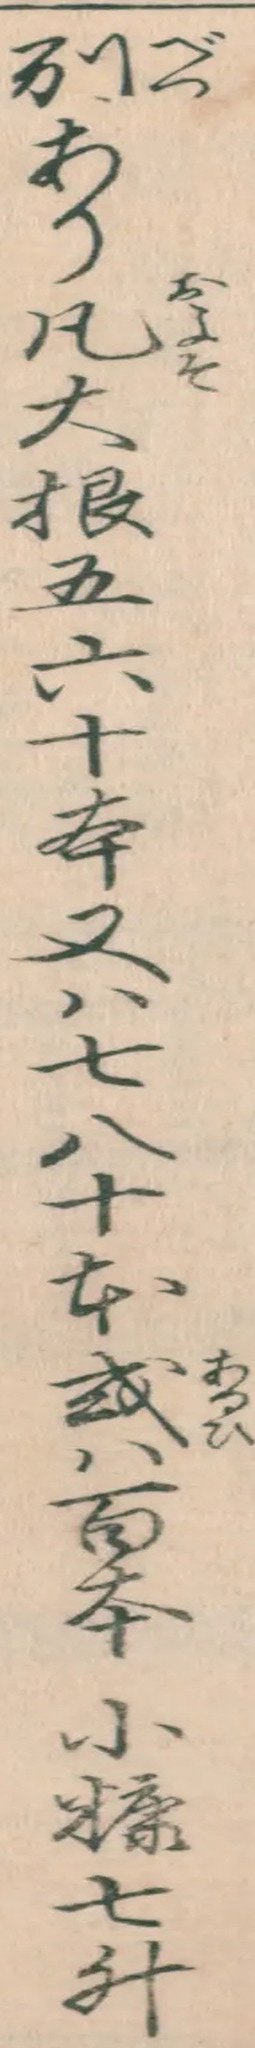別あり凡大根五六十本又は七八十本或は百本小糠七升
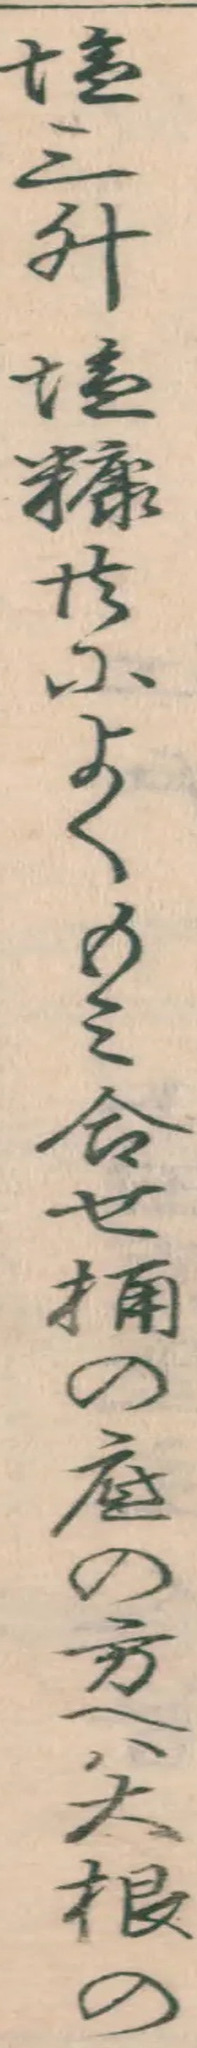塩三升塩糠共によくもみ合せ桶の底の方へは大根の
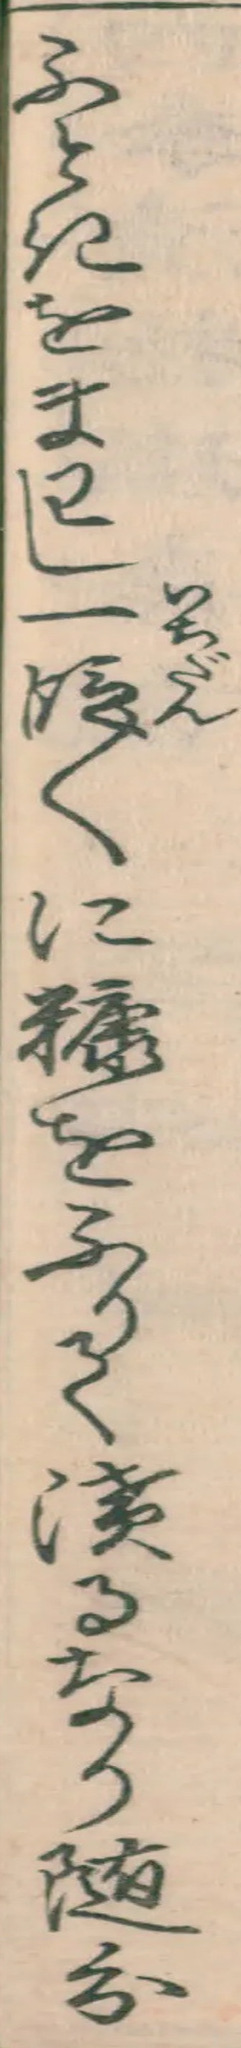ふときをまわし一段〳〵に糠をふりて漬るなり随分
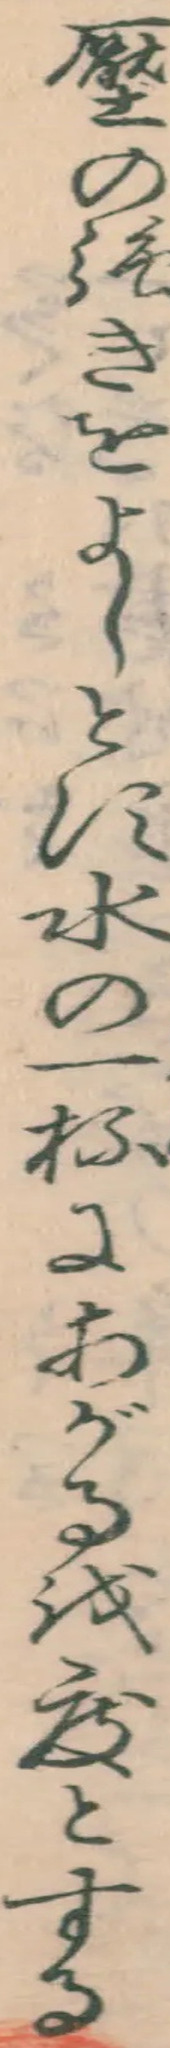圧の強きをよしとす水の一杯にあがるを度とする
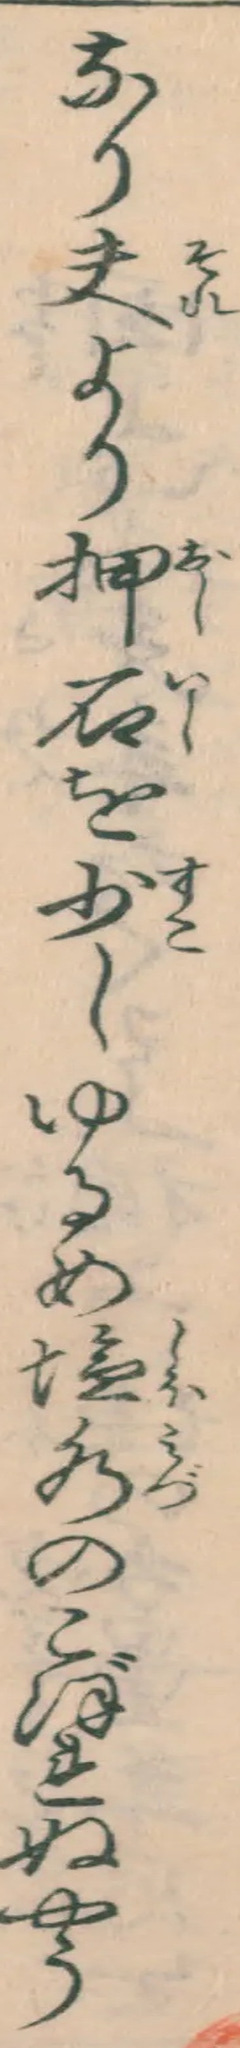なり夫より押石を少しゆるめ塩水のこぼれぬやう
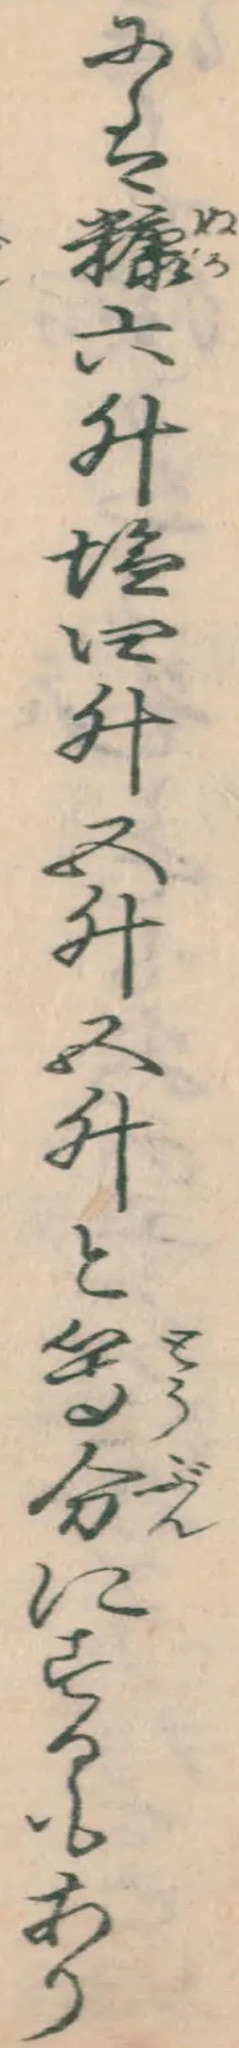には糠六升塩四升五升五升と等分にするもあり
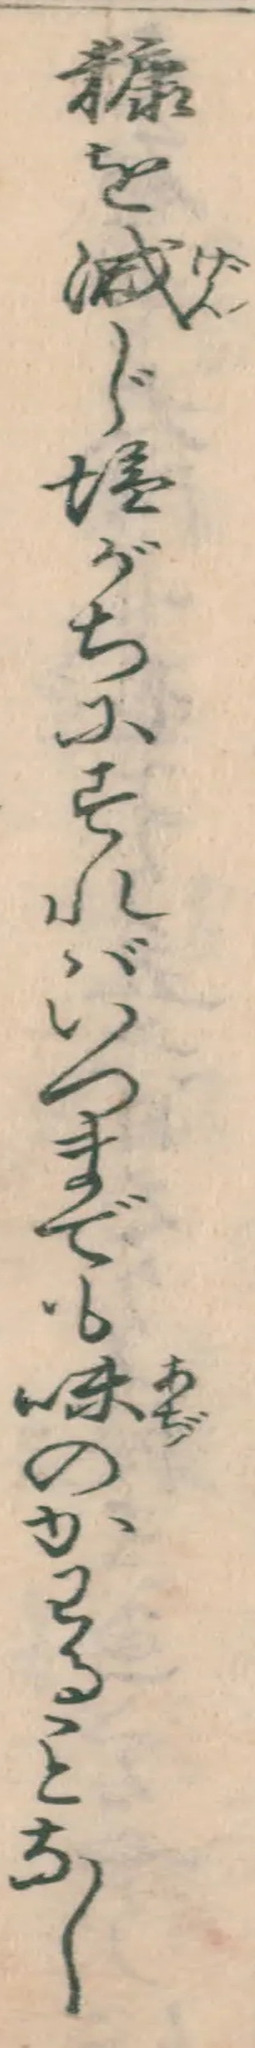糠を減じ塩がちにすればいつまでも味のかわることなし
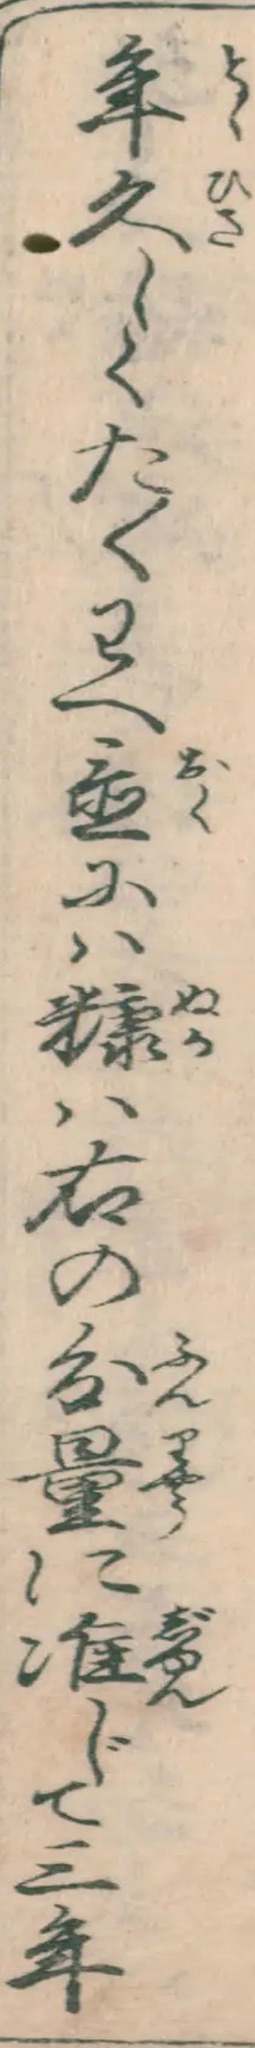年久しくたくわへ置には糠は右の分量に准じて三年

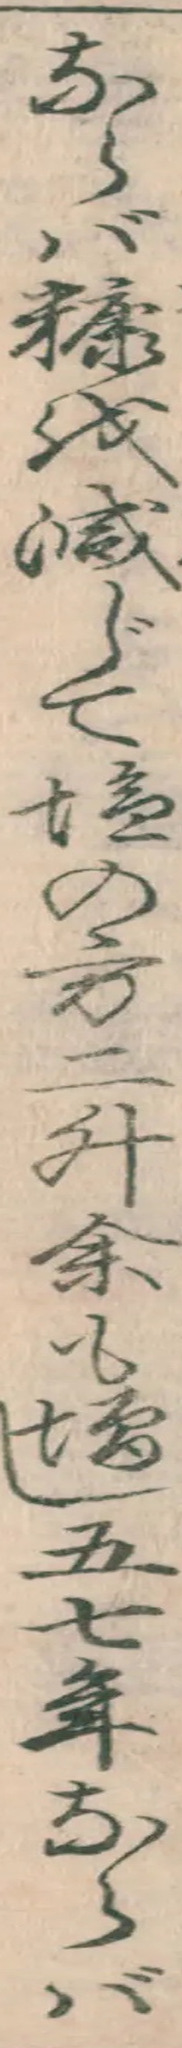ならば糠を減じて塩の方二升余も増し五七年ならば
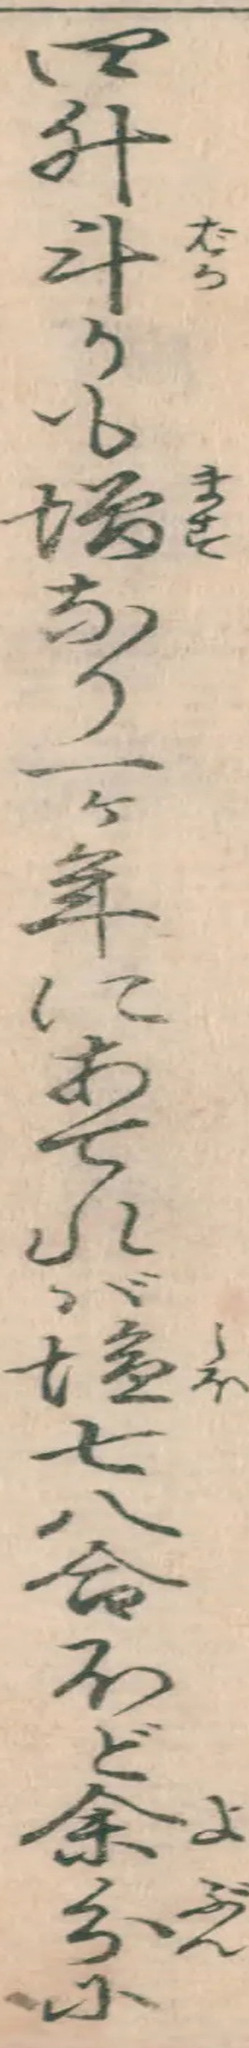四升斗りも増なり一ヶ年にあてれば塩七八合ほど余分に
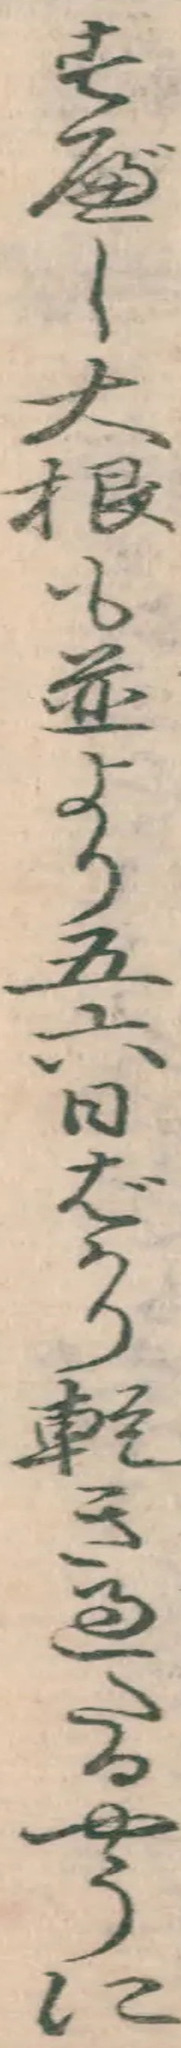すべし大根も並より五六日ばかり乾き過たるやうに
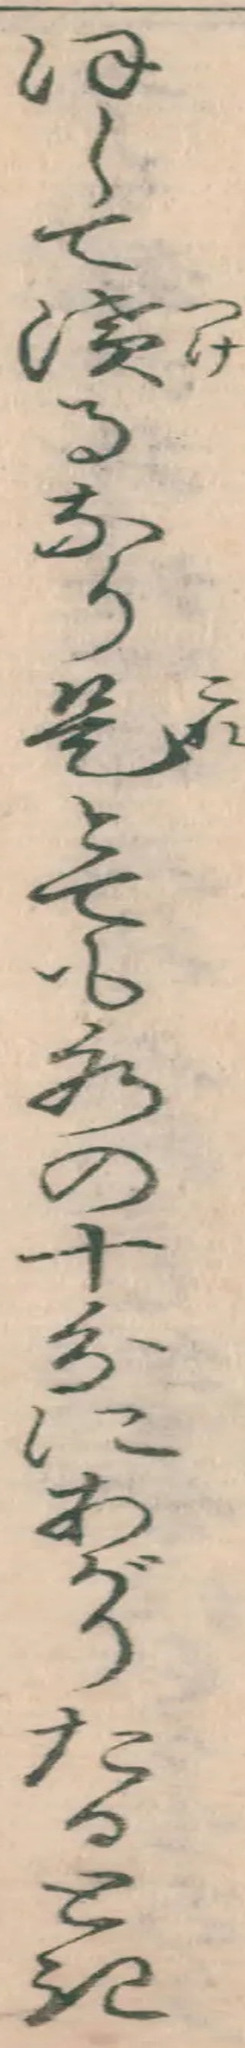ほして漬るなり是とても水の十分にあがりたるとき
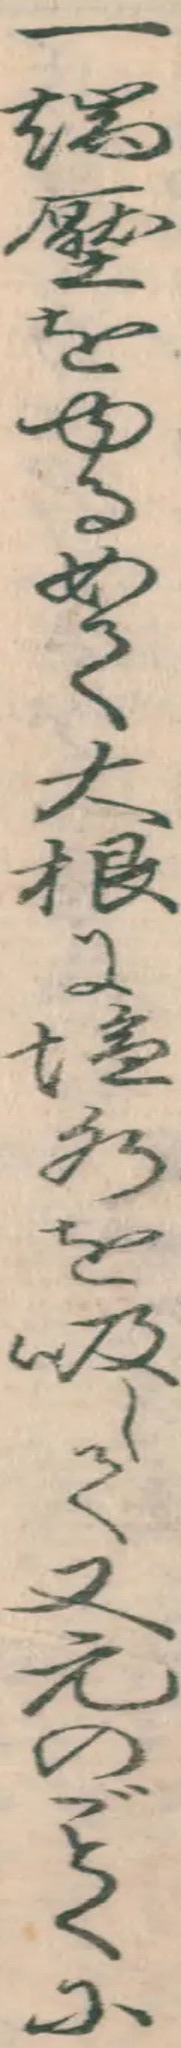一端圧をゆるめて大根に塩水を吸して又元のごとくに
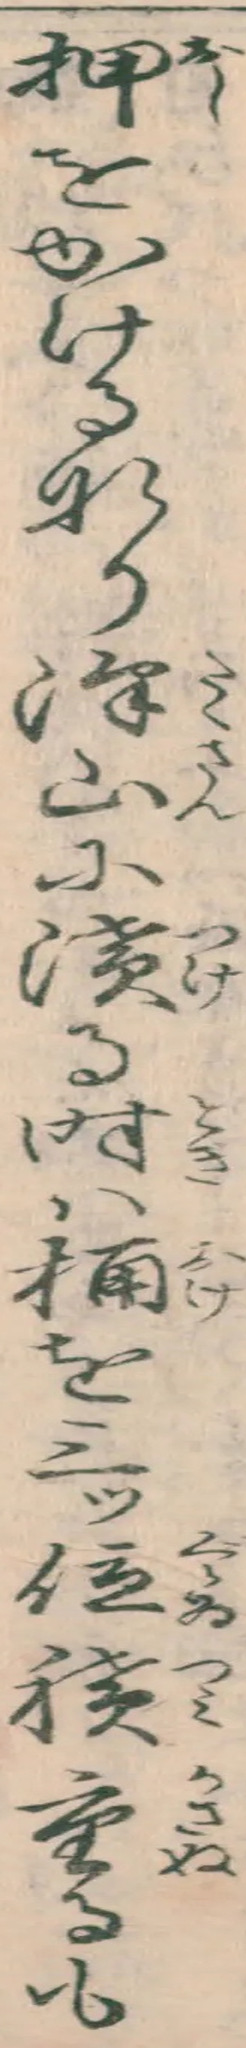押をかけるなり沢山に漬る時は桶を三ッ位積重るも
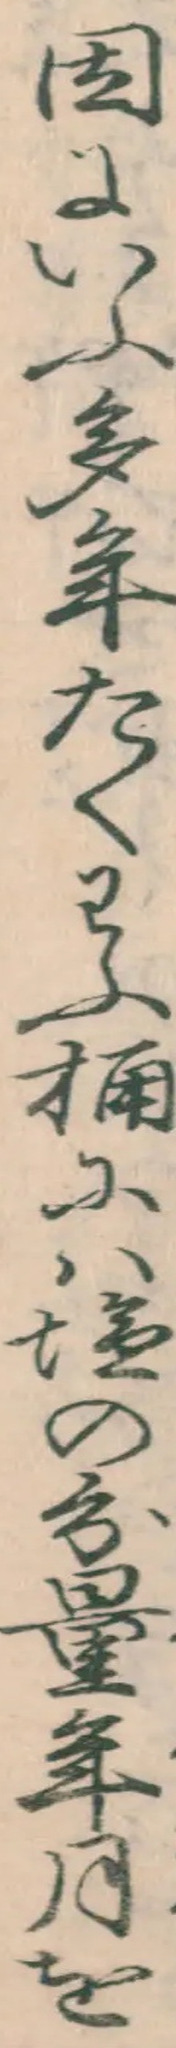因にいふ多年たくわふ桶には塩の分量年月を
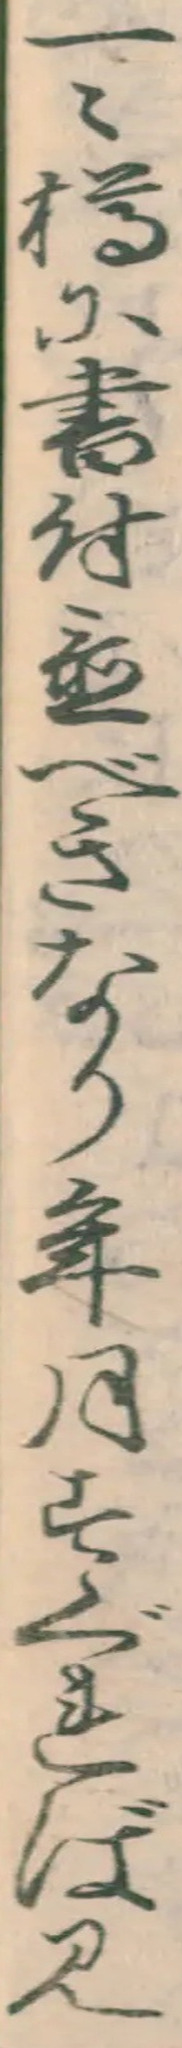一々樽に書付置べきなり年月すぐれば見
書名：四季漬物鹽嘉言
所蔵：国立国会図書館 National Diet Library, JAPAN
